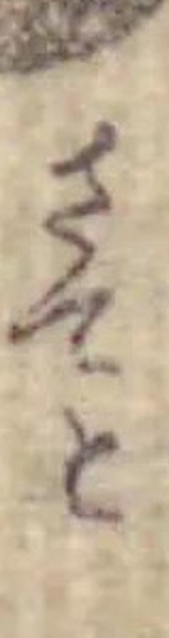さてと
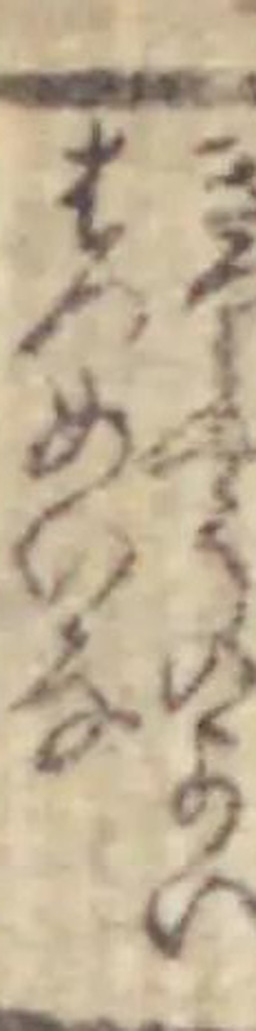はつめいな
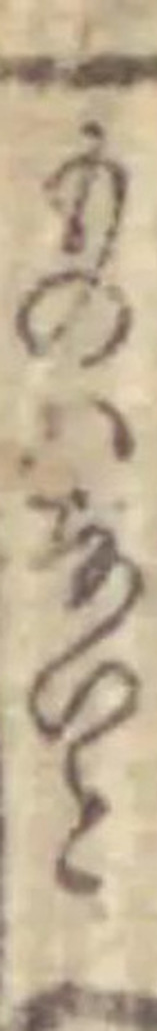ものはないと
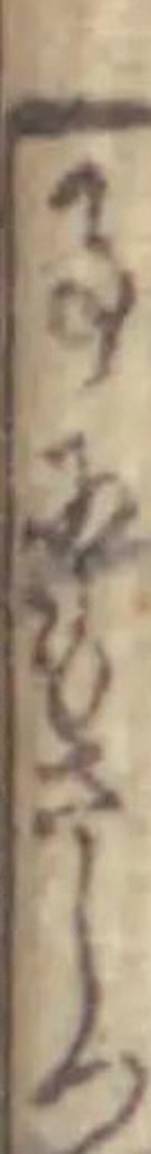事にもさしつ
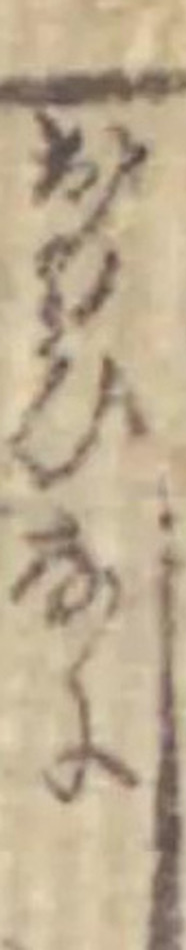おもひなに
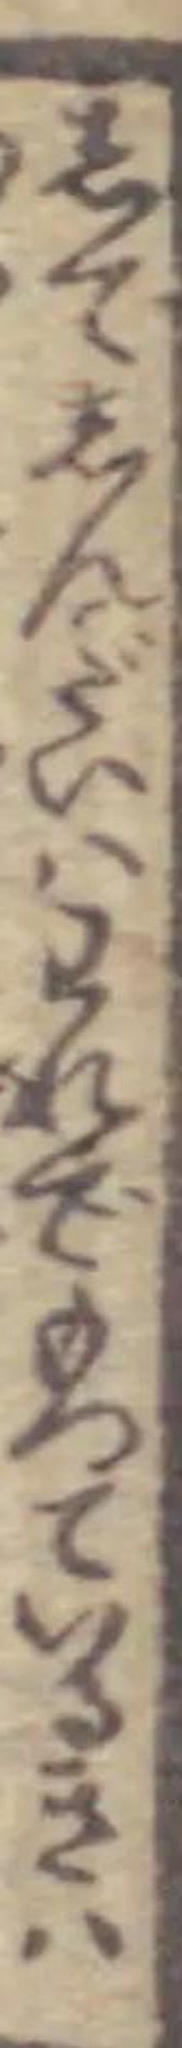してしんだいはわれでもつているきは
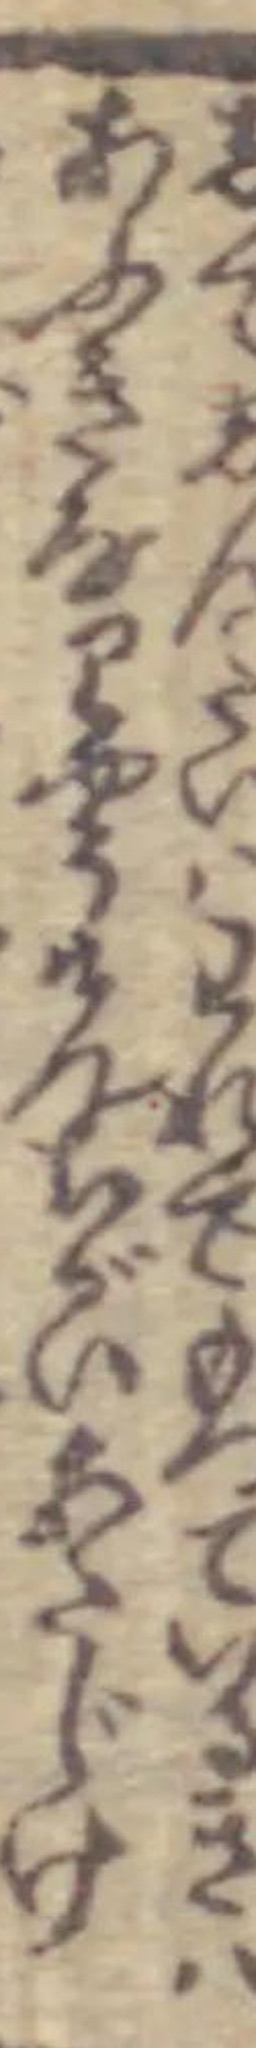あふきなりやうけんちがいあたじけ
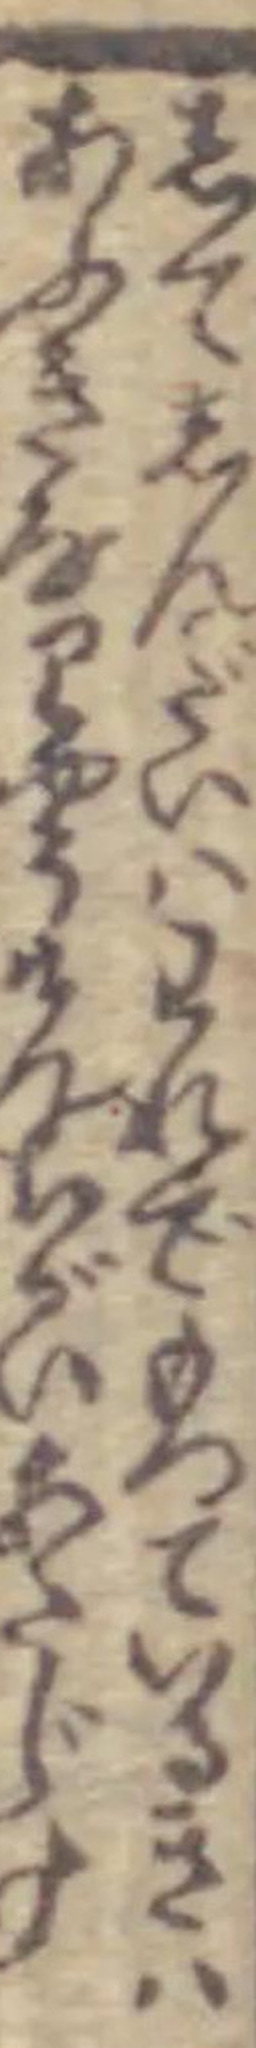あふきなりやうけんちがいあたじけ
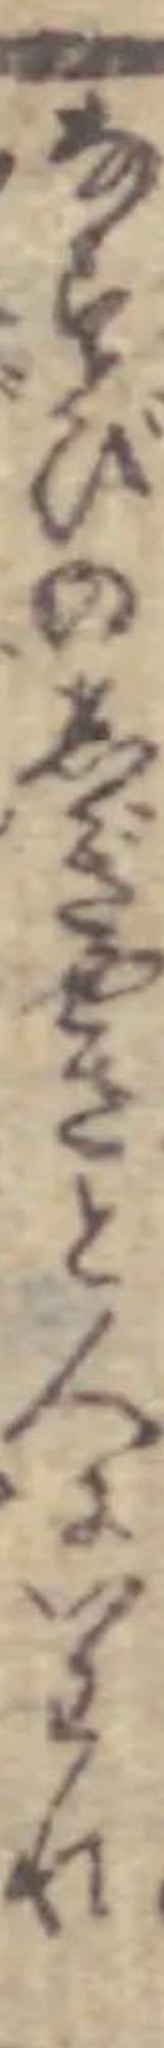なすびのしぎやきと人にいわれ
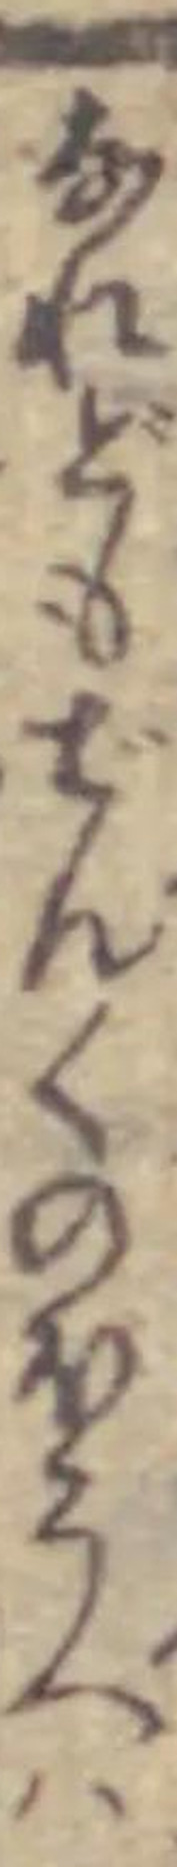なれどもぢんくのほうへは
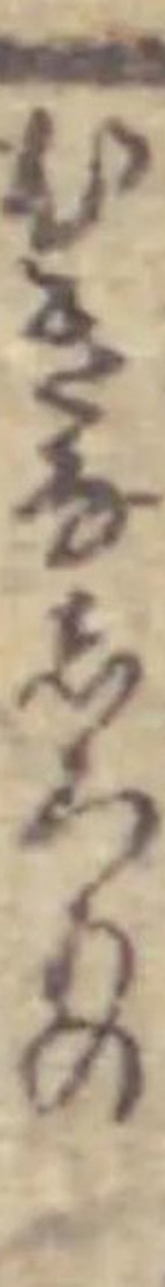むきなしろもの
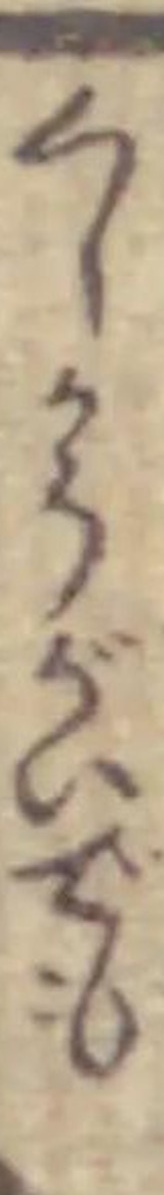くしかうがいでも
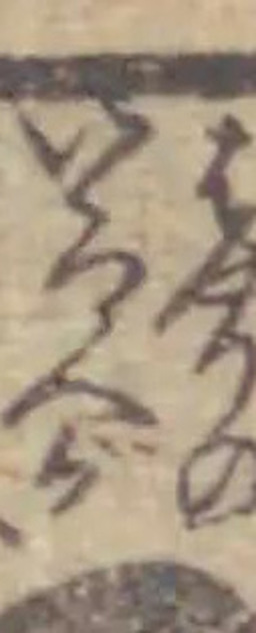いろ人が
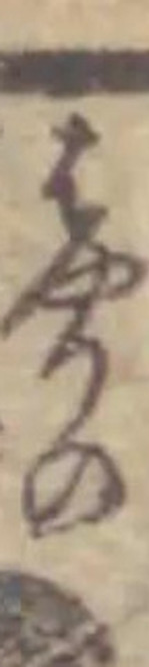はやりの
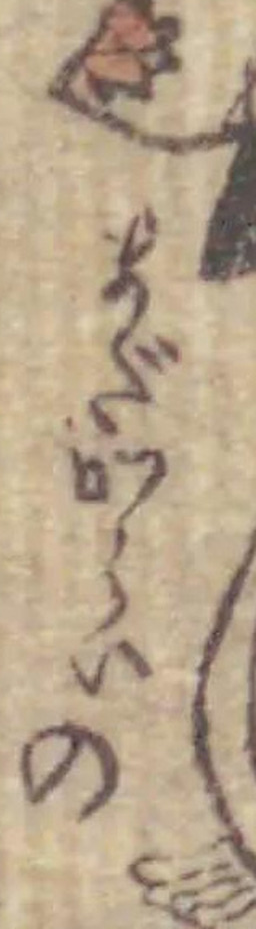まだからいの
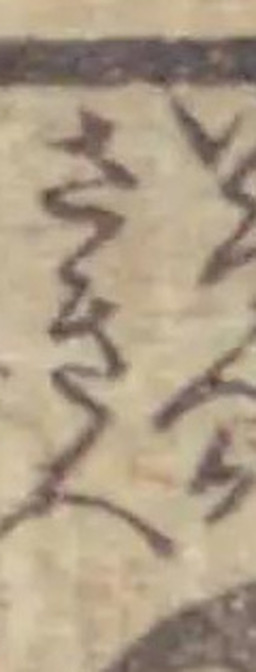さきへ
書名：珍説女天狗 2巻
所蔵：国立国会図書館 National Diet Library, JAPAN
